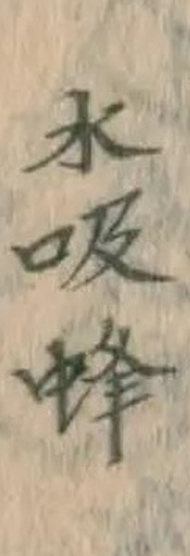水吸蜂
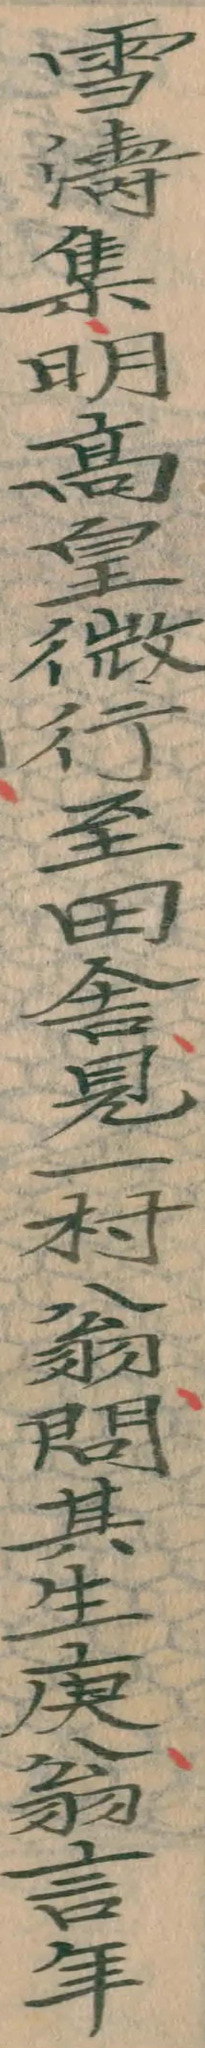雪濤集、明高皇微行至田舎、見一村翁、問其生庚、翁言年
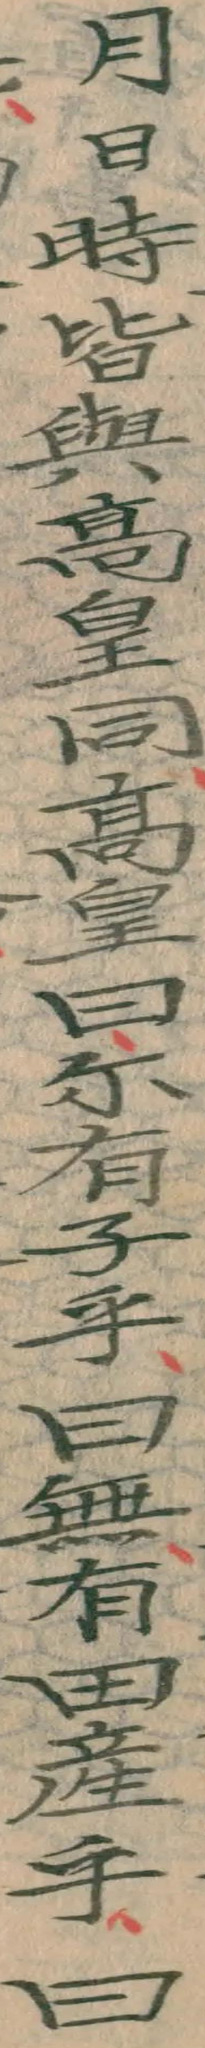月日時皆與高皇同、高皇曰、尓有子乎、曰無、有田産乎、曰
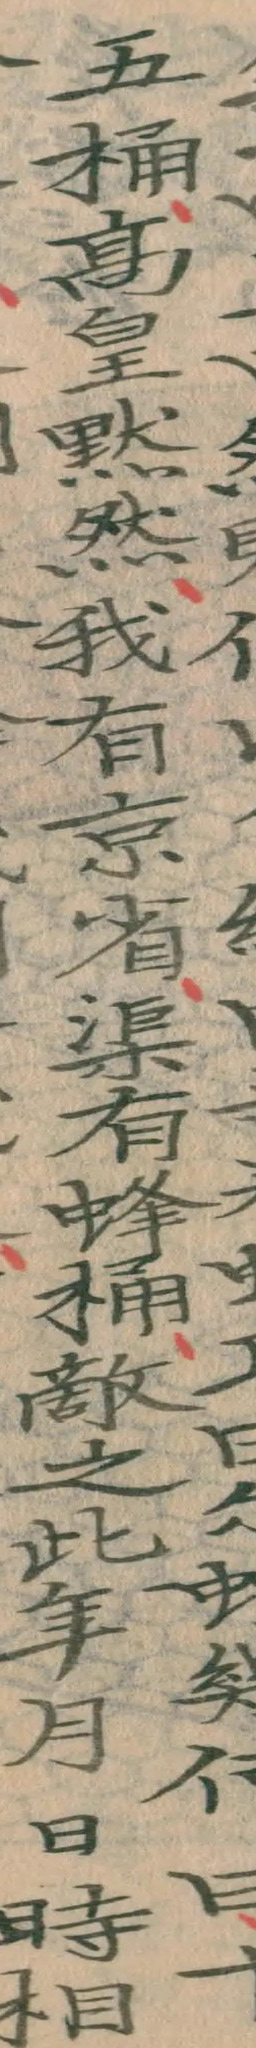五桶、高皇黙然、我有京省、渠有蜂桶、敵之此年月日時相
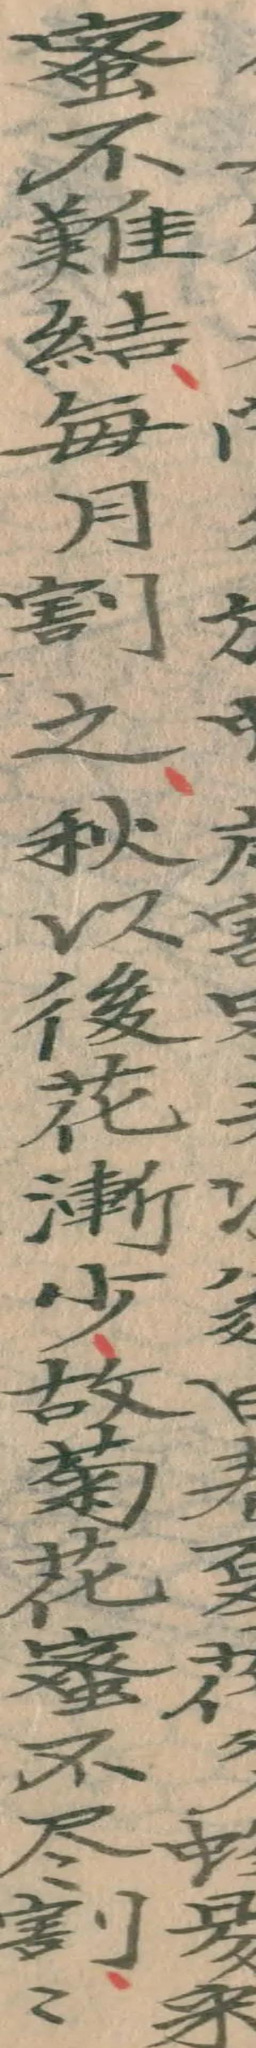蜜不難結、毎月割之、秋以後花漸少、故菊花蜜不尽割、〻
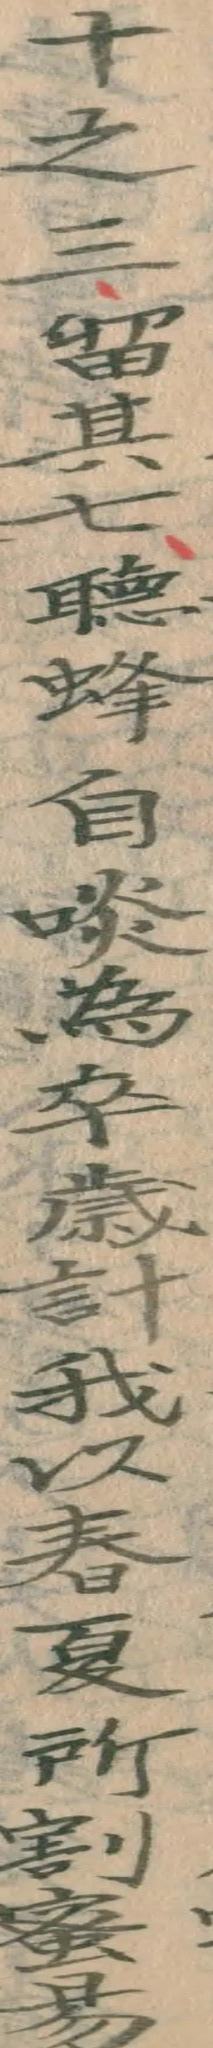十之三、留其七、聴蜂自啖為卒歳計我以春夏所割蜜易
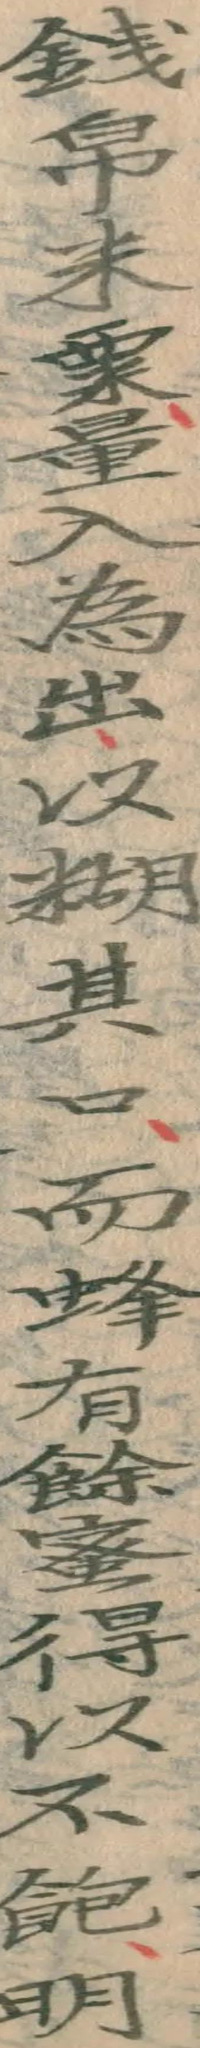銭帛米粟、量入為出、以糊其口、而蜂有餘蜜得以不飽、明
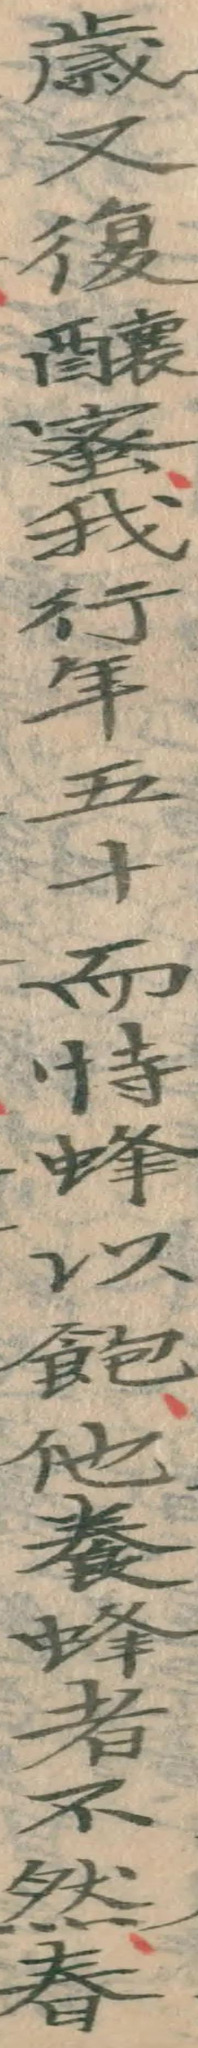歳又復醸蜜、我行年五十而恃蜂以飽、他養蜂者不然、春
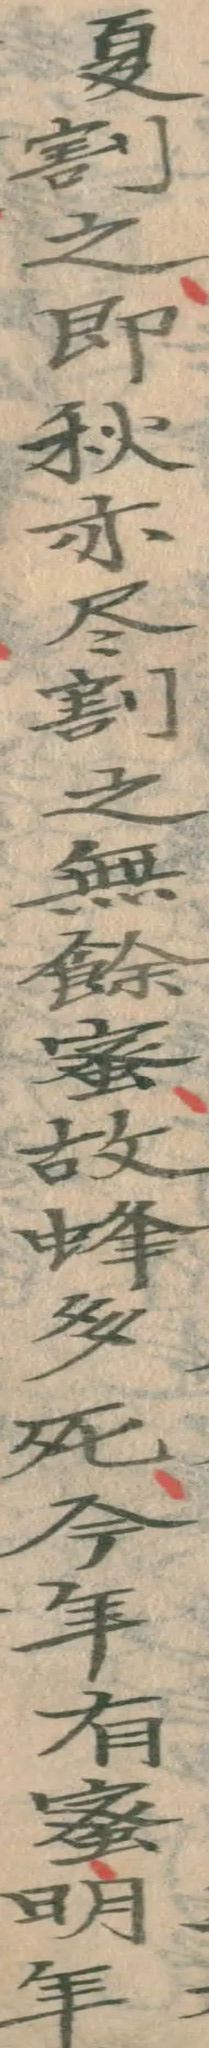夏割之、即秋亦尽割之無餘蜜、故蜂多死、今年有蜜、明年
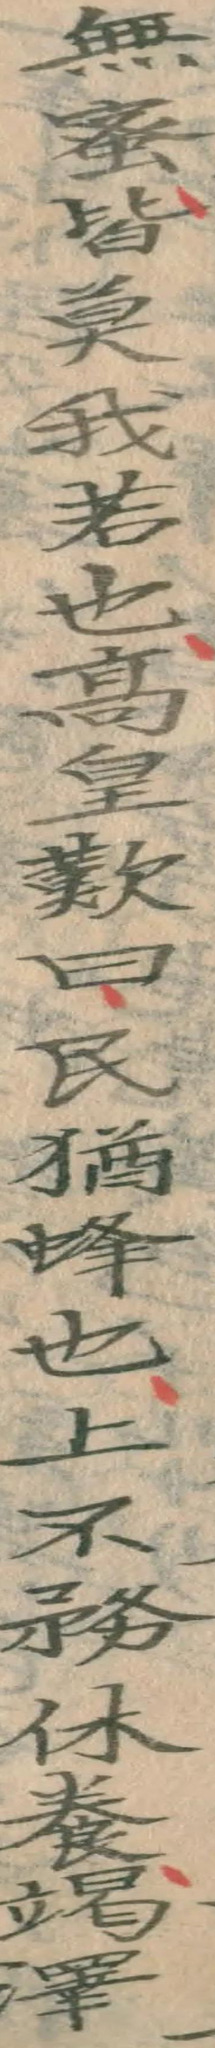無蜜、皆莫我若也、高皇歎曰、民猶蜂也、上不務休養、竭澤
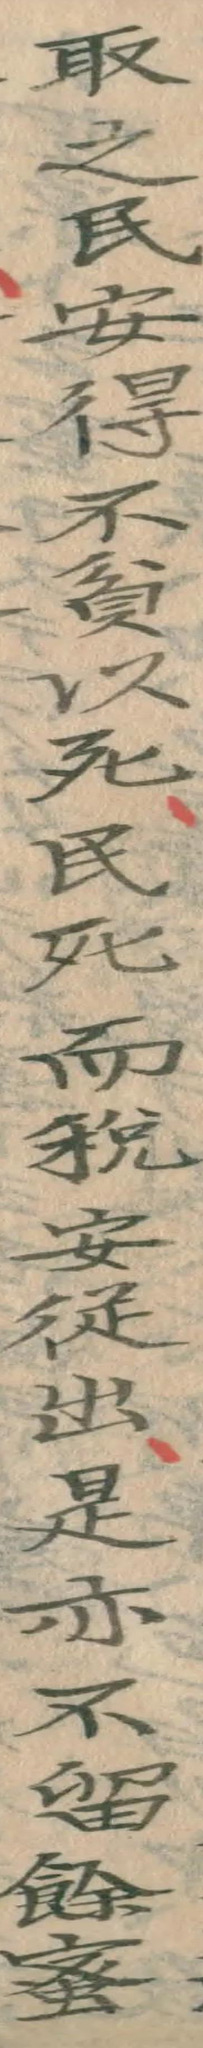取之民安得不貧以死、民死而税安従出、是亦不留餘蜜
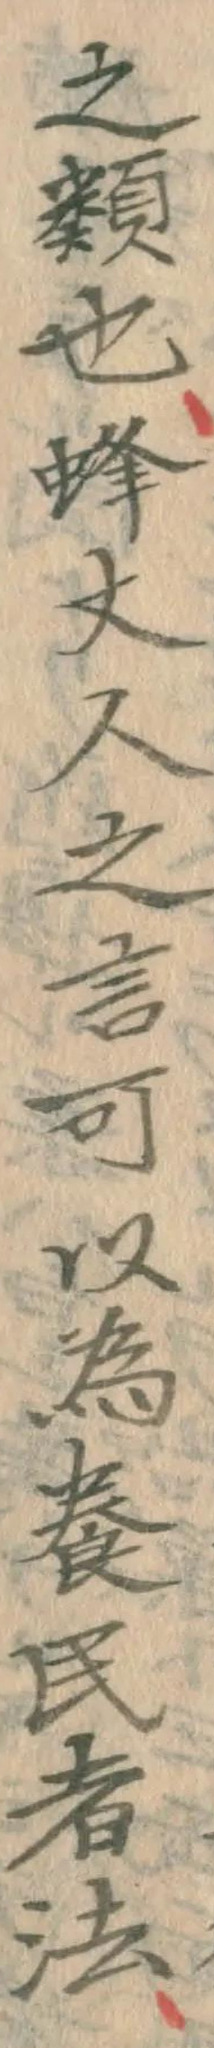之類也、蜂丈人之言可以為養民者法、

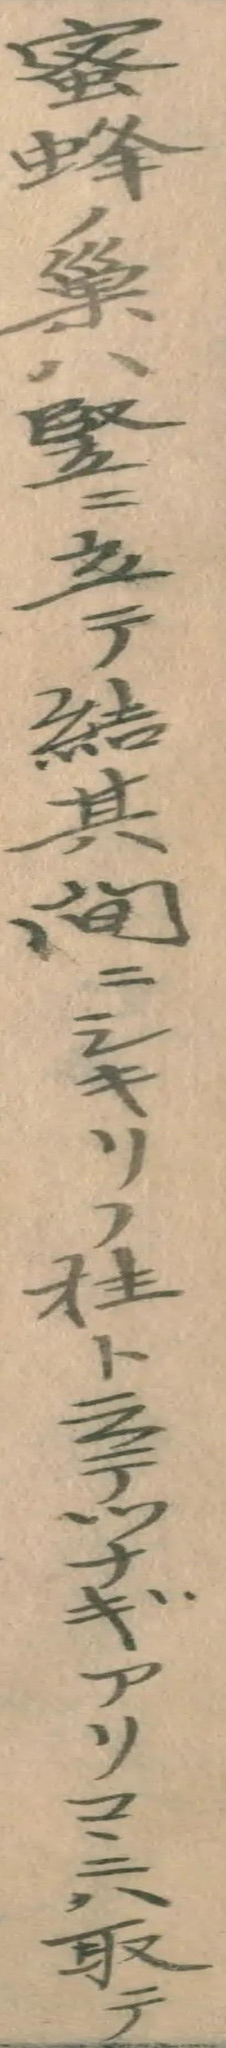蜜蜂ノ巣ハ竪ニ立テ結其間ニシキリノ柱ト云テツナギアリコヽニハ取テ
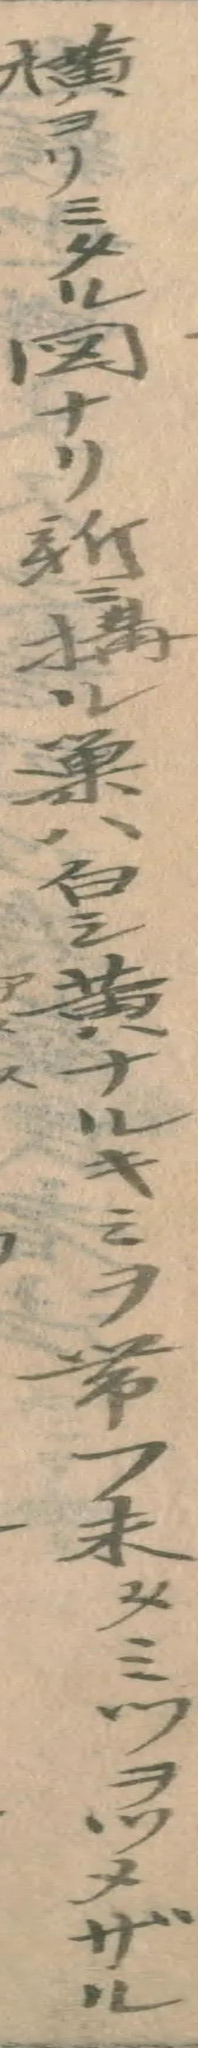横ヨリミタル図ナリ新ニ搆ル巣ハ白シ黄ナルキミヲ帶フ未タミツヲツメザル
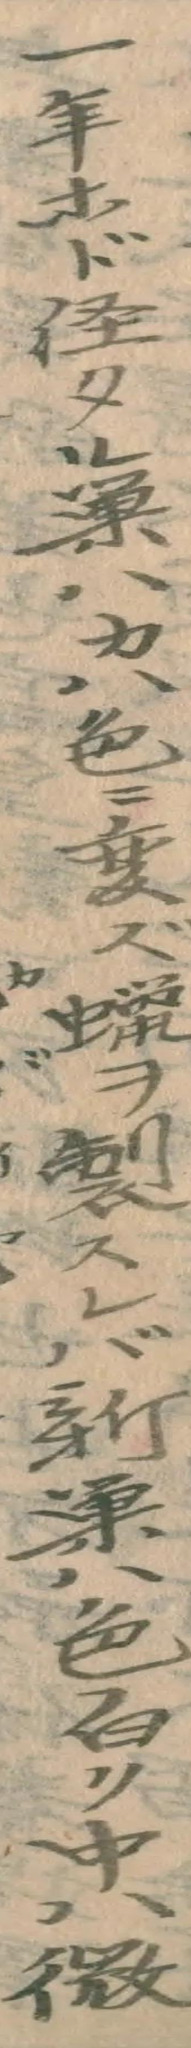一年ホド経タル巣ハカハ色ニ変ズ蠟ヲ製スレバ新巣ハ色白ク中ハ微
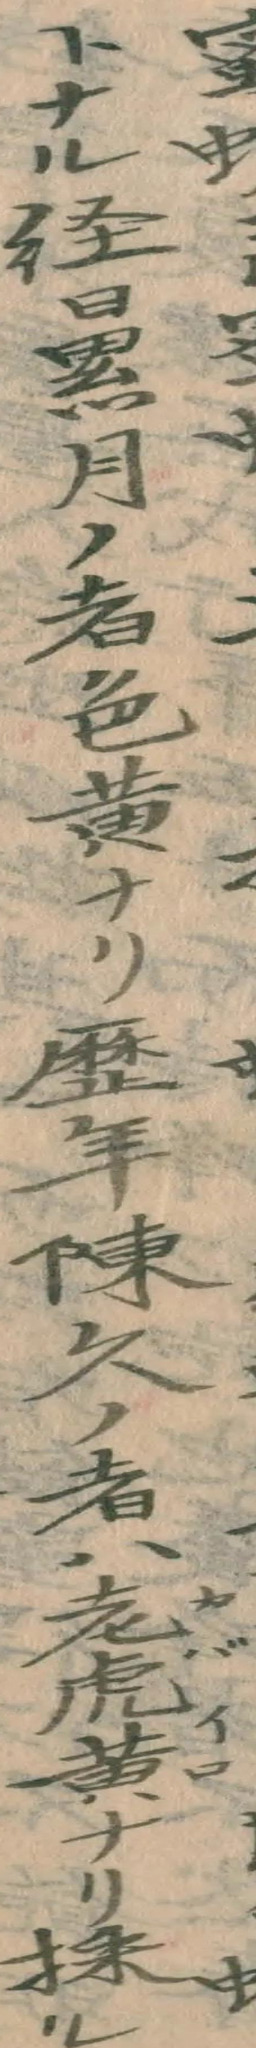トナル経日累月ノ者色黄ナリ歴年陳久ノ者ハ老虎黄ナリ採ル
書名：千蟲譜 3巻. [1]
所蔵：国立国会図書館 National Diet Library, JAPAN
